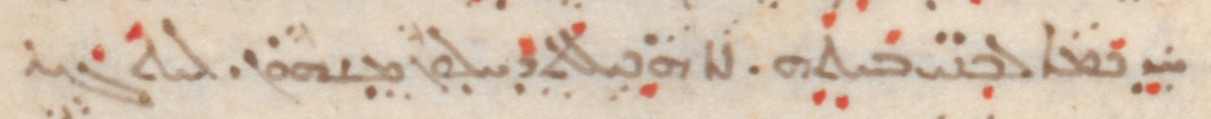ܚܕ ܟܡܐ ܠܒܢ̈ܝ ܒܝܬܗ. ܠܐ ܗܟܝܠ ܬ ܕܚܠܘܢ ܡܢܗܘܢ. ܠܝܬ ܓܝܪ
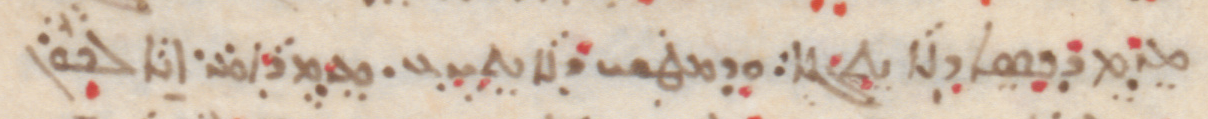ܡܕܡ ܕܟܣܐ ܕܠܐ ܢܬܓܐ: ܘܕܡܛܫܝ ܕܠܐ ܢܬܝܕܥ. ܡܕܡ ܕܐܡ̇ܪ ܐܢܐ ܠܟܘܢ
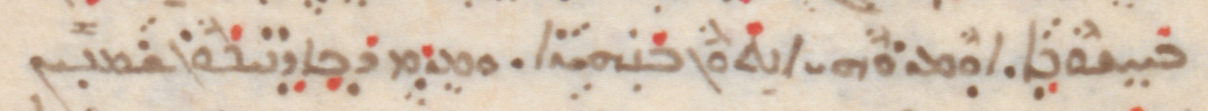ܒܚܫܘܟܐ. ܐܘܡܪܘܗܝ ܐܢܬܘܢ ܒܢܗܝܪ̈ܐ. ܘܡܕܡ ܕܒܐܕܢܝ̈ܟܘܢ ܫ̇ܡܥܝܢ
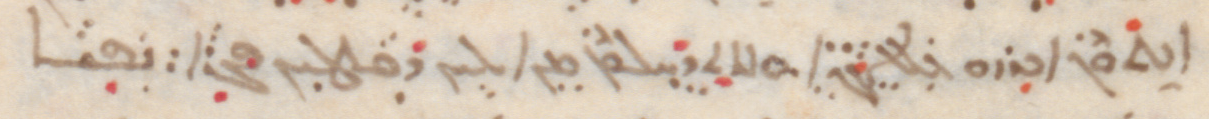ܐܢܬܘܢ ܐܟܪܙܘ ܥܠ ܐܓܪ̈ܐ ܘܠܐ ܬܕܚܠܘܢ ܡ̣ܢ ܐܝܠܝܢ ܕܩ̇ܛܠܝܢ ܦܓܪܐ: ܢܦܫܐ
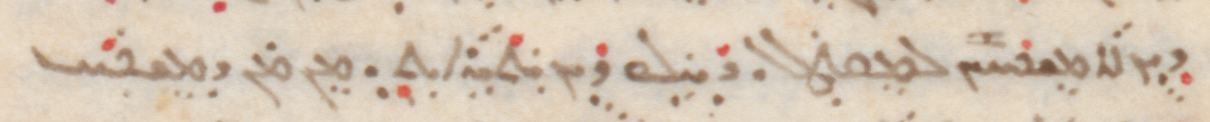ܕܝܢ ܠܐ ܡܫܟܚܢ ܠܡܩܛܠ. ܕܚܠܘ ܕܝܢ ܝܬܝܪܐܝܬ: ܡ̣ܢ ܡ̇ܢ ܕܡܫܟܚ
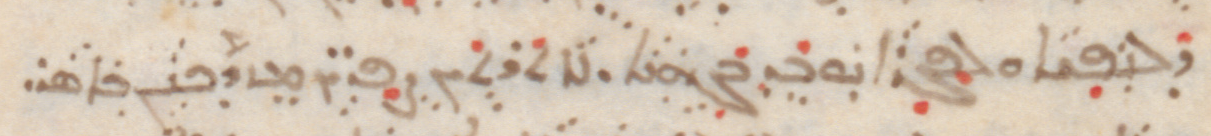ܕܠܢܦܫܐ ܘܠܦܓܪܐ ܢܘܒܕ ܒܓܗܢܐ. ܠܐ ܬܪܬܝܢ ܨܦܪ̈ܝܢ ܡܙܕܒܢ̈ܢ ܒܐܣܪ.
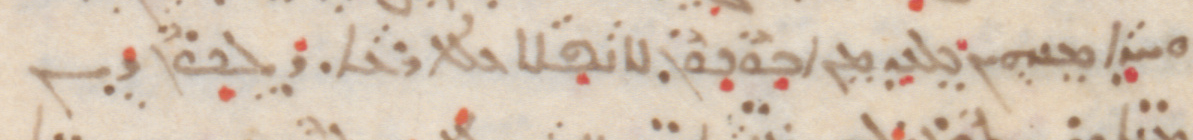ܘܚܕܐ ܡܢܗܝܢ ܒܠܥܕ ܡ̣ܢ ܐܒܘܒܘܢ. ܠܐ ܢܦܠܐ ܥܠ ܐܪܥܐ. ܕܠܟܘܢ ܕܝܢ
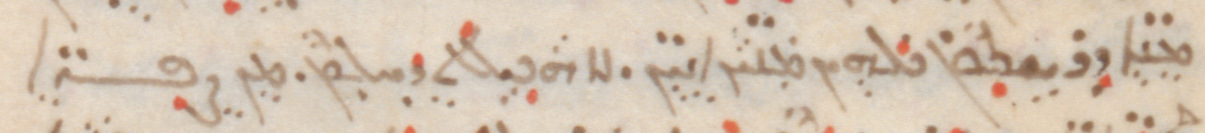ܡ̈ܢܐ ܕܪܝܫܟܘܢ ܟܠܗܝܢ ܡܢܝ̈ܢ ܐܢܝ̈ܢ. ܠܐ ܗܟܝܠ ܬܕܚܠܘܢ. ܡ̣ܢ ܨܦ̈ܐ
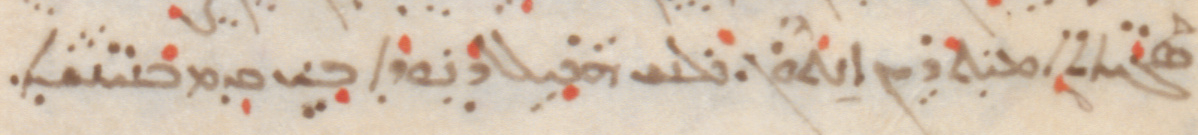ܣܓ̈ܝܐܬܐ ܡܝܬܪܝܢ ܐܢܬܘܢ. ܟܠܢܫ ܗܟܝܠ ܗܟܝܠܐ ܕܢܘܕܐ ܒܝ ܩܕܡ ܒܢܝ̈ܢܫܐ܆
